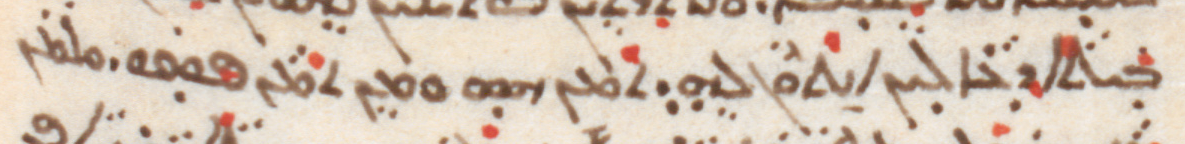ܒܝܬܐ ܕܥ̇ܐܠܝܢ ܐܢܬܘܢ ܠܗ܆ ܬܡܢ ܗܘܘ ܘܡ̣ܢ ܬܡܢ ܦܘܩܘ. ܘܠܡ̇ܢ
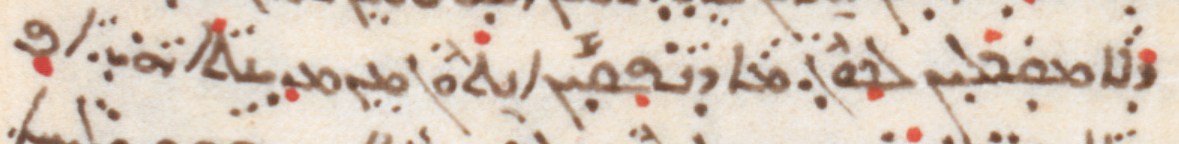ܕܠܐ ܡܩܒܠܝܢ ܠܟܘܢ܆ ܡܐ ܕܢܦܩܝܢ ܐܢܬܘܢ ܡ̣ܢ ܡܕܝܢܬܐ ܗ̇ܝ܆ ܐܦ
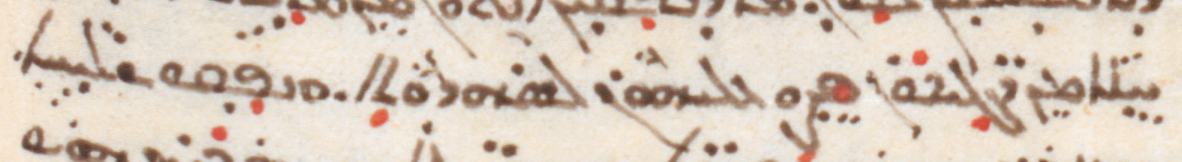ܚܠܐ ܡ̣ܢ ܪ̈ܓܠܝܟܘܢ ܦܨܘ ܥܠܝܗܘܢ ܠܣܗܕܘܬܐ. ܘܢܦܩ̣ܘ ܫ̈ܠܝܚܐ
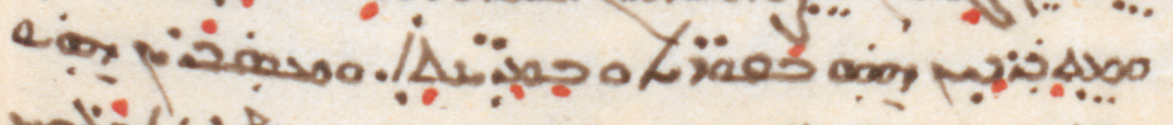ܘܡܬܒܪܟܝܢ ܗܘܘ ܒܩܘܪ̈ܝܐ ܘܒܡܕܝܢܬܐ܆ ܘܡܣܒܪܝܢ ܗܘܘ ܘ
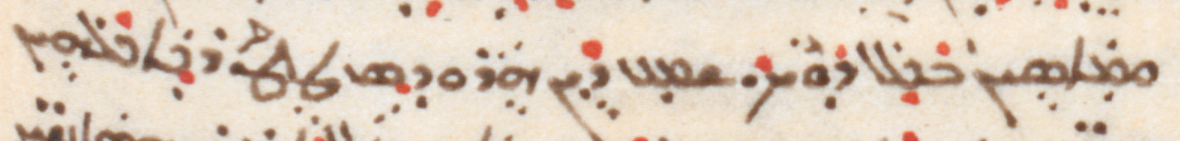ܘܡܐܣܝܢ ܒܟܠ ܕܘܟ. ܫܡ̣ܥ ܕܝܢ ܗܪܘܕܣ ܬܛܪܪܟܐ ܟܠܗܝܢ
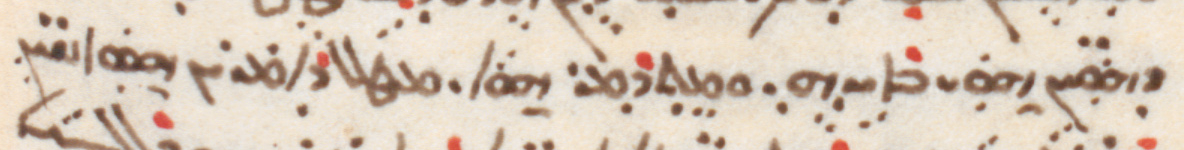ܕܗܘ̈ܝܢ ܗܘܝ ܒܐܝܕܗ܆ ܘܡܬ̣ܕܡܪ ܗܘܐ. ܡܛܠ ܕܐܡ̇ܪܝܢ ܗܘܘ ܐܢܫܝ̈ܢ
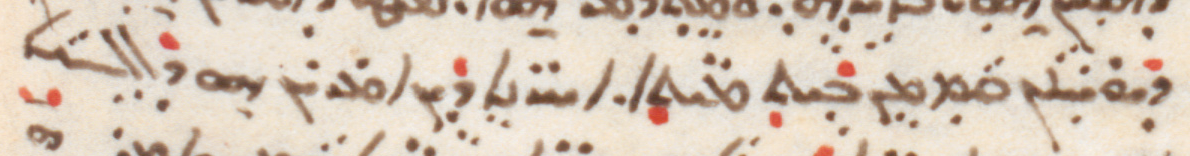ܕܝܘܝܢܢ ܩܡ̣ ܡ̣ܢ ܒܝܬ ܡܝ̈ܬܐ. ܐܚܪ̈ܢܐ ܕܝܢ ܐܡܪܝܢ ܗܘܘ ܕܐܠܝܐ
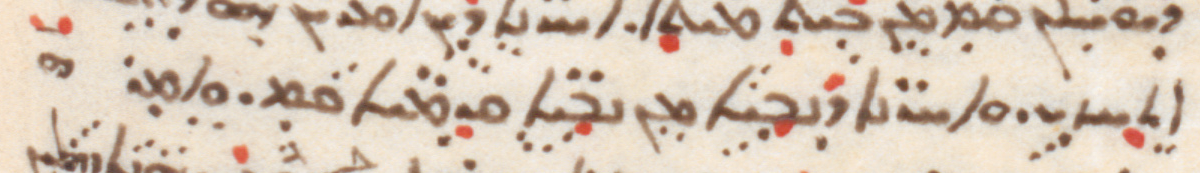ܐܬܚܙܝ. ܘܐܚܪ̈ܢܐ ܕܢܒܝܐ ܡ̣ܢ ܢܒ̈ܝܐ ܩܕܡ̈ܝܐ ܩܡ. ܘܐܡ̣ܪ ܏ܗ
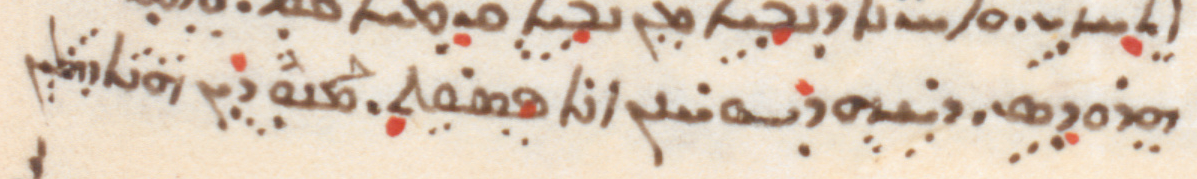ܗܪܘܕܣ. ܪܝܫܗ ܕܝܘܚܢܢ ܐܢܐ ܦܣܩܬ. ܡܢܘ ܕܝܢ ܗܢܐ ܕܗܠܝܢ
